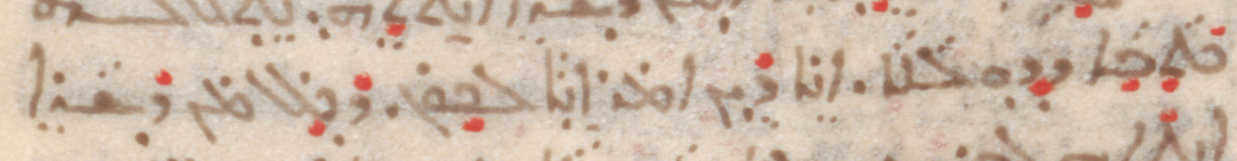ܟܬܒܐ ܕܕܘܠܠܐ. ܐܢܐ ܕܝܢ ܐܡ̇ܪ ܐܢܐ ܠܟܘܢ܇ ܕܟܠ ܡ̇ܢ ܕܫܪܐ
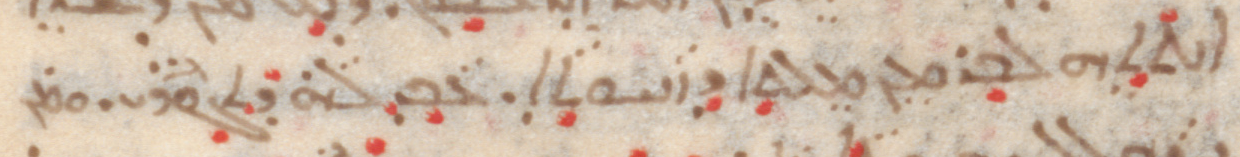ܐܢܬܬܗ ܠܒܪ ܡܢ ܡܠܬܐ ܕܙܢܝܘܬܐ܆ ܥܒܕ ܠܗ̇ ܕܬܓܘܪ ܘܡ̇ܢ
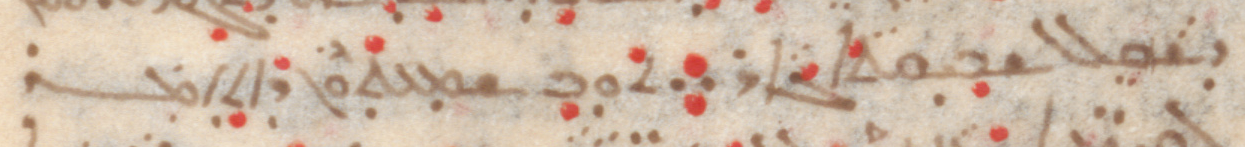ܕܫܩܠ ܫܒܝܩܬܐ ܓܐܪ܀ ܬܘܒ ܫܡ̣ܥܬܘܢ ܕܐܬܐܡܪ
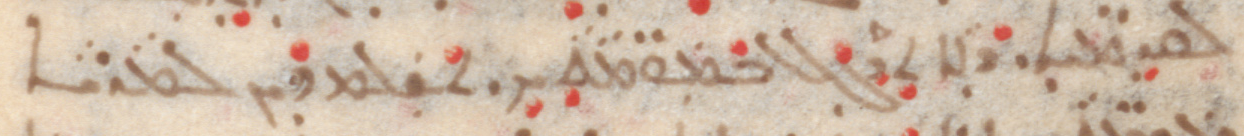ܠܩܕܡ̈ܝܐ܆ ܕܠܐ ܬܕܓܠ ܒܡܘ̈ܡܬܟ. ܬܫܠܡ ܕܝܢ ܠܡܪܝܐ
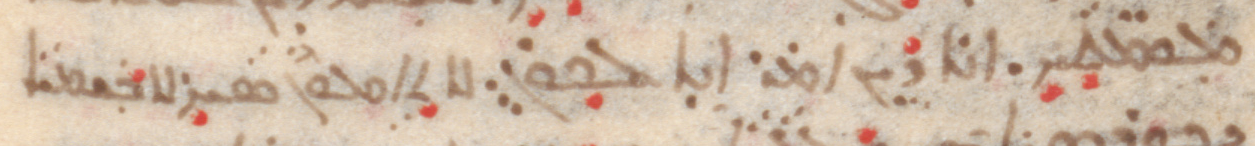ܡܘܡ̈ܬܟ. ܐܢܐ ܕܝܢ ܐܡ̇ܪ ܐܢܐ ܠܟܘܢ܆ ܠܐ ܬܐܡܘܢ ܣܟ ܠܐ ܒܫܡܝܐ
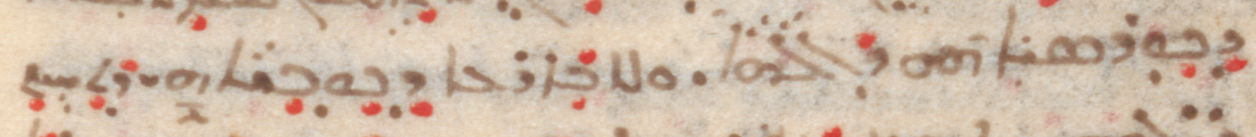ܕܟܘܪܣܝܐ ܗܘ ܕܐܠܗܐ. ܘܠܐ ܒܐܪܥܐ ܕܟܘܒܫܐ ܗܝ ܕܬܚܝܬ
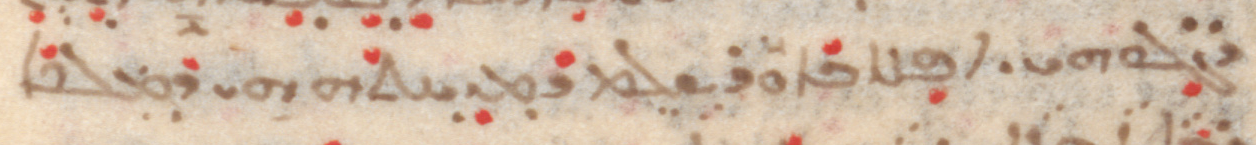ܪ̈ܓܠܘܗܝ ܐܦܠܐ ܒܐܘܪܝܫܠܡ ܕܡܕܝܢܬܗ ܗܝ ܕܡܠܟܐ
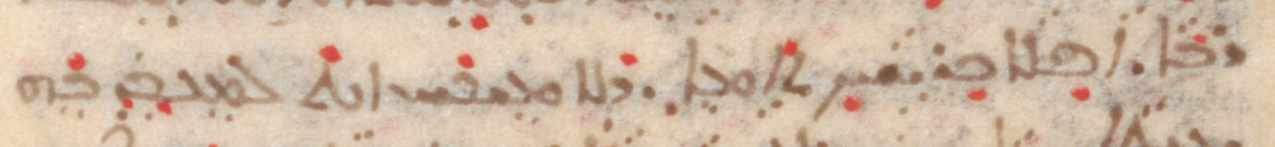ܪܒܐ. ܐܦܠܐ ܒܪܝܫܟ ܬܐܡܐ܆ ܕܠܐ ܡܫܟܚ ܐܢܬ ܠܡܥܒܕ ܒܗ
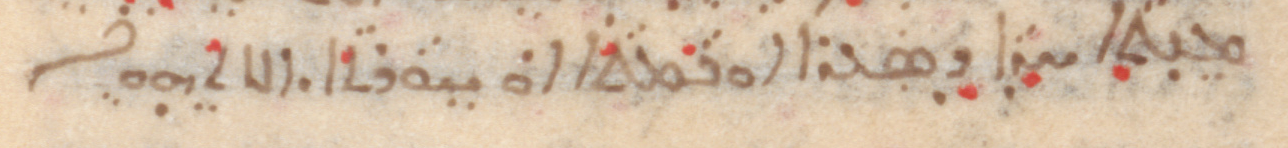ܡܢܬܐ ܚܕܐ ܕܣܥܪܐ ܐܘܟܡܬܐ ܐܘ ܚܘܪܬܐ. ܐܠܐ ܬܗܘܐ
